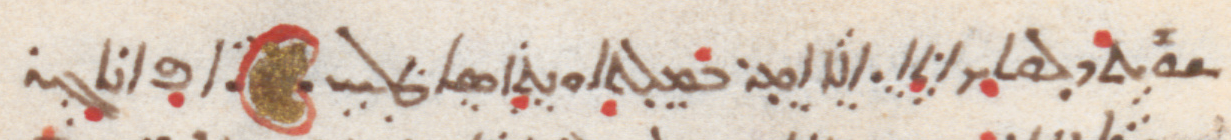ܫܘܝܬ ܕܠܘܬܟ ܐܬ̇ܐ. ܐܠܐ ܐܡ̣ܪ ܒܡܠܬܐ ܘܢܬܐܣܐ ܛܠܝܝ. ܐܦ ܐܢܐ ܓܝܪ
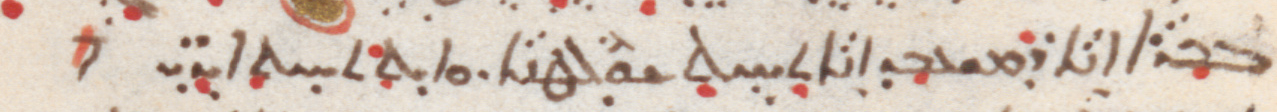ܓܒܪܐ ܐܢܐ ܕܡܫܥܒܕ ܐܢܐ ܬܚܝܬ ܫܘܠܛܢܐ. ܘܐܝܬ ܬܚܝܬ ܐܝ̈ܕܝ ܏ܐ
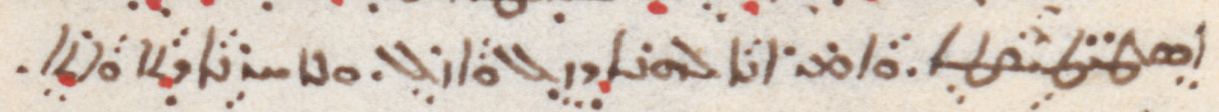ܐܣܛܪ̈ܛܝܘܛܐ. ܘܐܡ̇ܪ ܐܢܐ ܠܗܢܐ ܕܙ̣ܠ ܘܐܙ̇ܠ. ܘܠܐܚܪܢܐ ܕܬܐ ܘܐܬ̇ܐ.
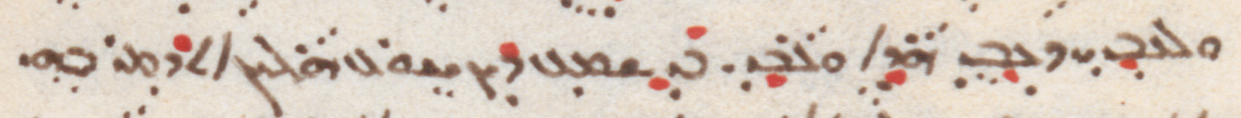ܘܠܥܒܕܝ ܕܥܒܕ ܗܕܐ ܘܥ̇ܒܕ. ܟܕ ܫܡ̣ܥ ܕܝܢ ܝܫܘܥ ܗܠܝܢ ܐܬܕܡܪ ܒܗ.
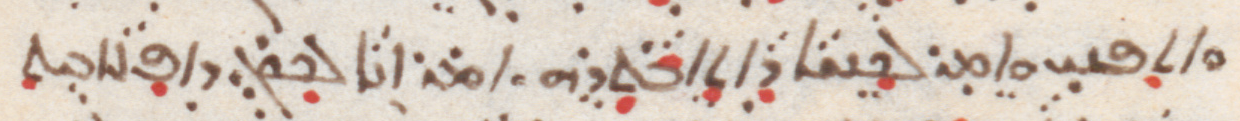ܘܐܬܦܢܝ ܘܐܡ̣ܪ ܠܟܢܫܐ ܕܐܬ̣ܐ ܒܬܪܗ. ܐܡ̇ܪ ܐܢܐ ܠܟܘܢ܆ ܕܐܦ ܠܐ ܒܝܬ
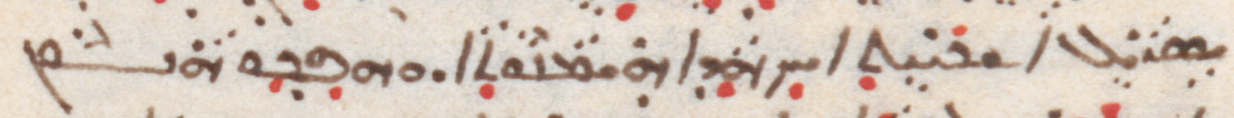ܝܣܪܝܠ ܐܫܟܚܬ ܐܝܟ ܗܕܐ ܗܝܡܢܘܬܐ. ܘܗܦܟ̣ܘ ܗ̇ܢܘܢ
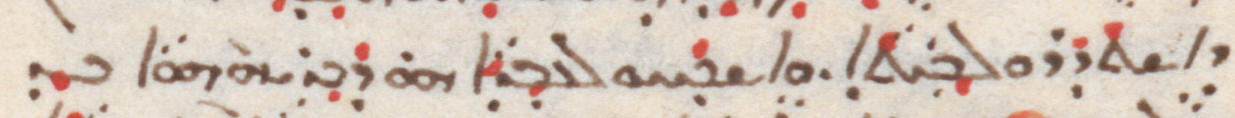ܕܐܫܬܕܪܘ ܠܒܝܬܐ. ܘܐܫܟ̣ܚܘ ܠܥܒܕܐ ܗ̇ܘ ܕܟܪܝܗ ܗܘܐ ܟܕ
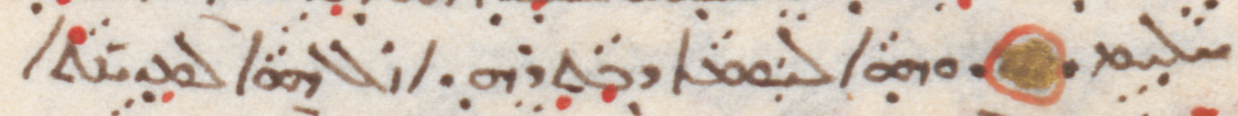ܚܠܝܡ. ܘܗܘܐ ܠܝܘܡܐ ܕܒܬܪܗ. ܐܙ̇ܠ ܗܘܐ ܠܡܕܝܢܬܐ
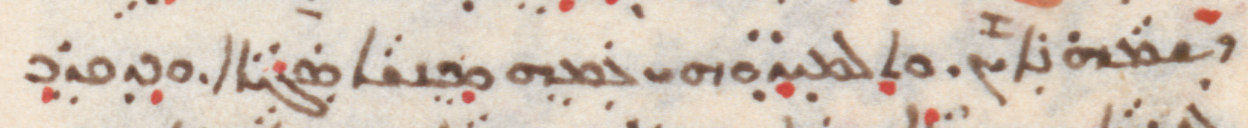ܕܫܡܗ̇ ܢܐܝܢ. ܘܬܠܡܝܕ̈ܘܗܝ ܥܡܗ ܘܟܢܫܐ ܣܓܝ̈ܐܐ. ܘܟܕ ܩܪܒ
